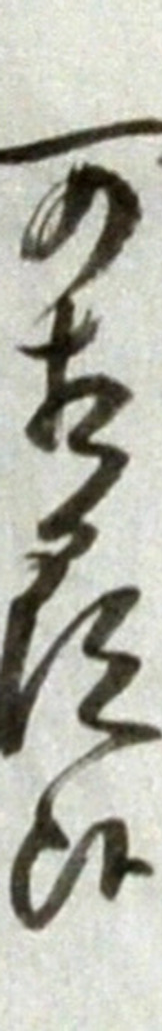可相尋候
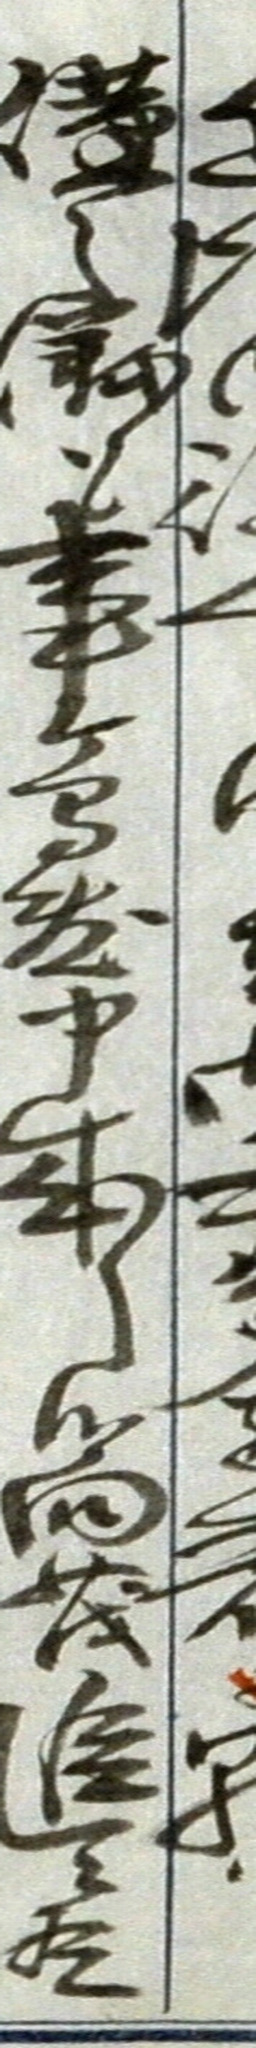僅之儀も事ヶ間敷申来り候向も追々有
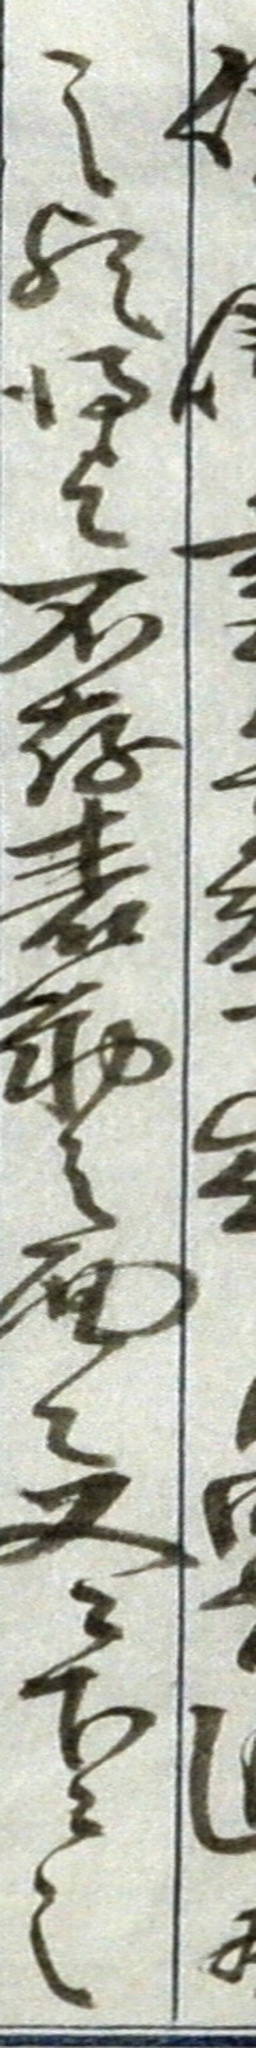之欤得と不存表勤之面々又々下々之
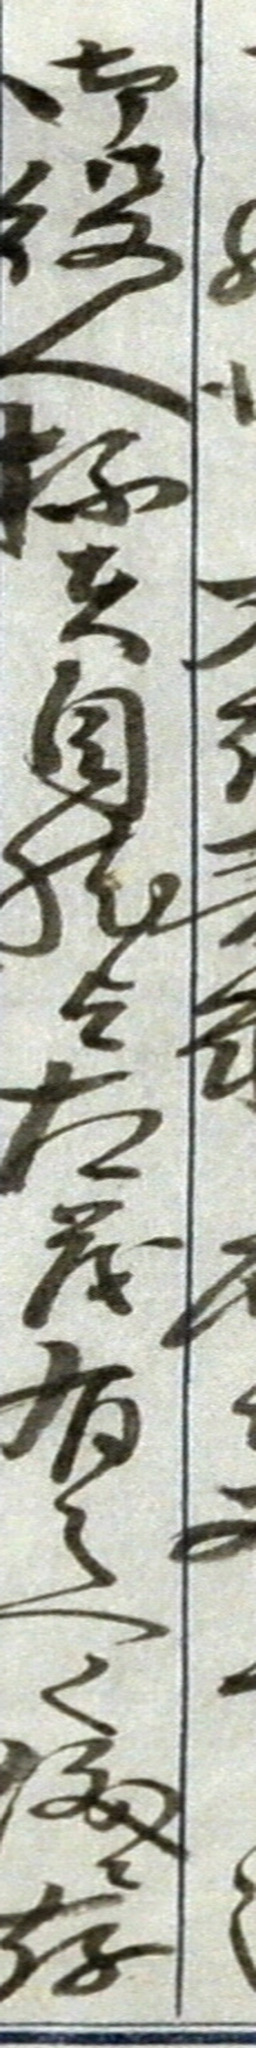御役人抔は自然と左も有之へく儀ニ存
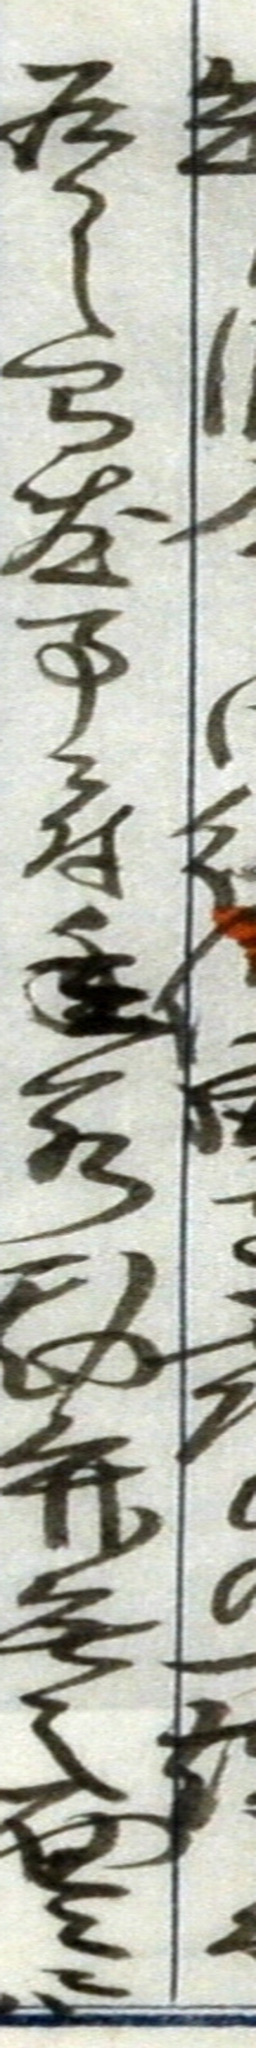有之間敷事ニ付年若勘弁無之面々ニハ
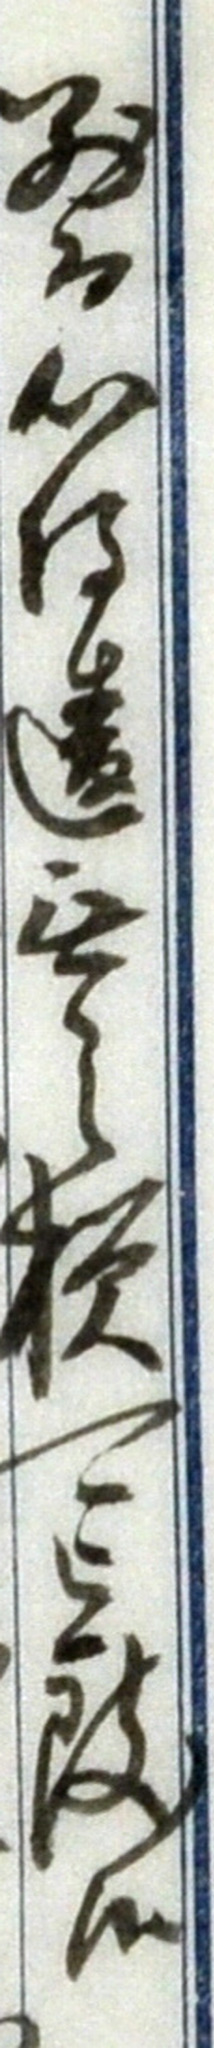別而心得違無之様可被致候
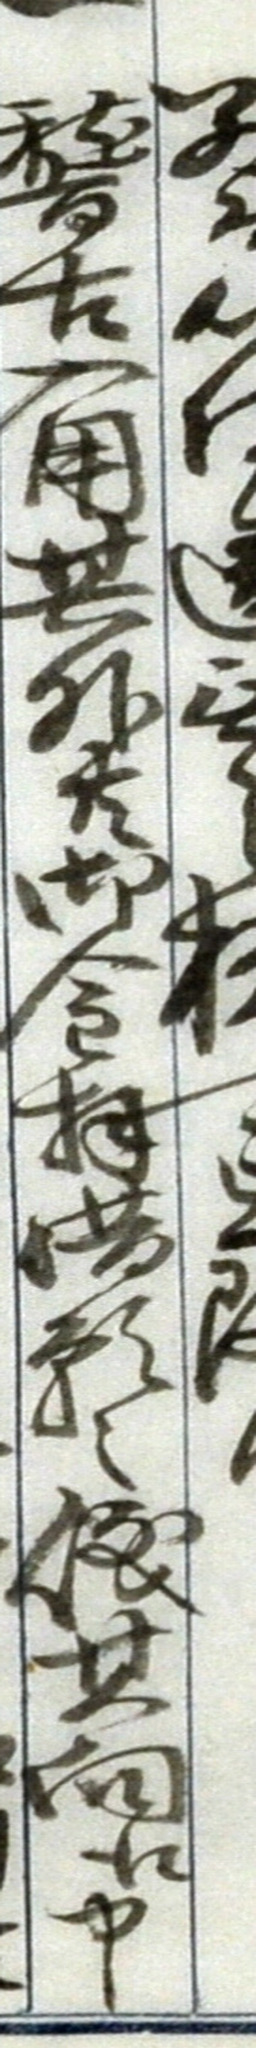一稽古入用其外共御金拝借願之儀其向江申
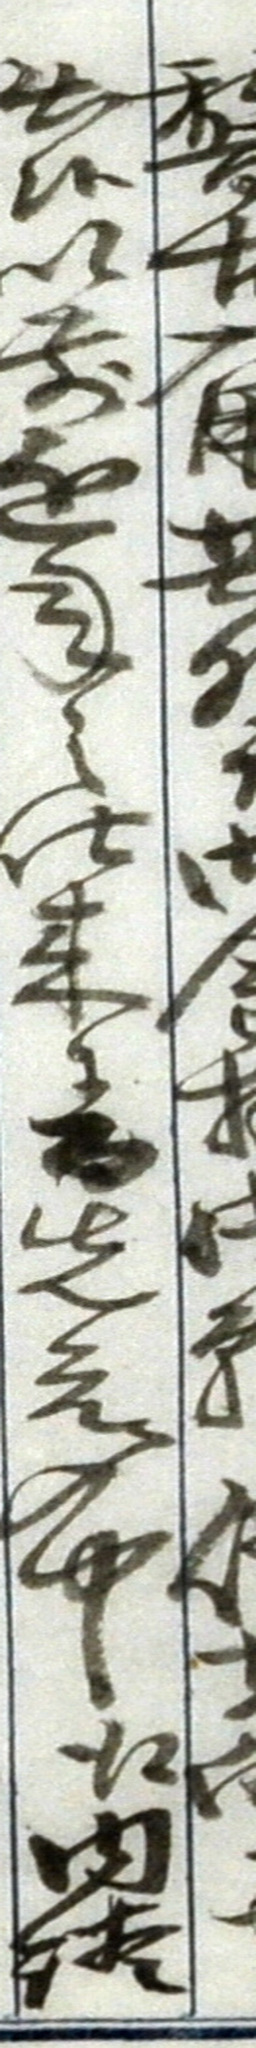出候以前近年之仕来に而先元〆中江内談
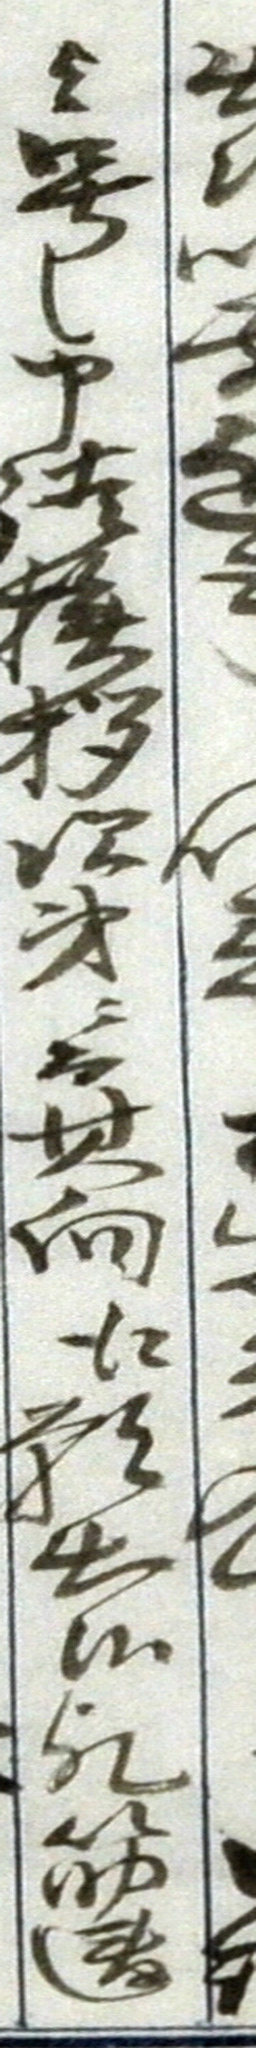と号し申談挨拶次第ニ而其向江願出候欤筋違
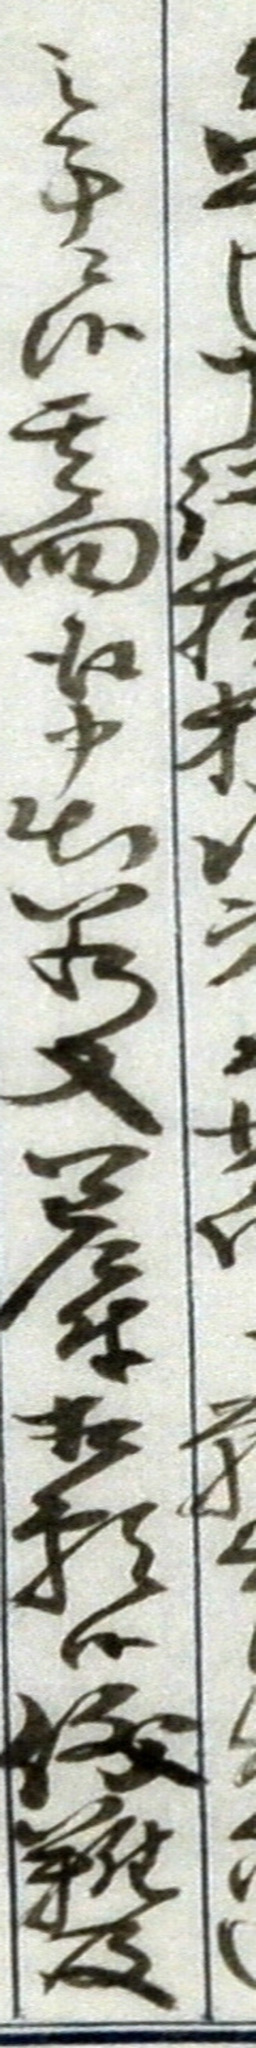之事ニ候其向江申出若又差付相願候儀難及
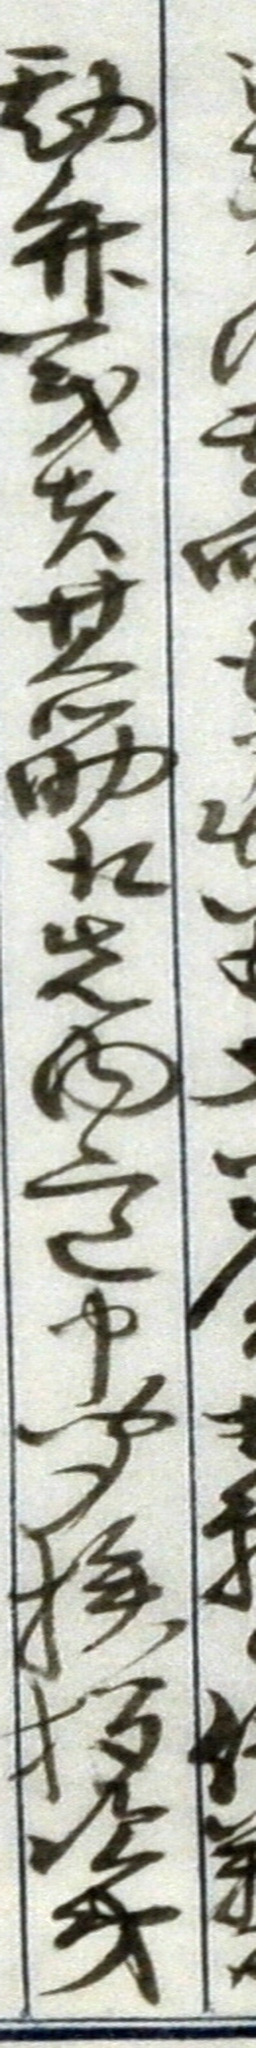勘弁義は其筋江先内意申聞挨拶次第
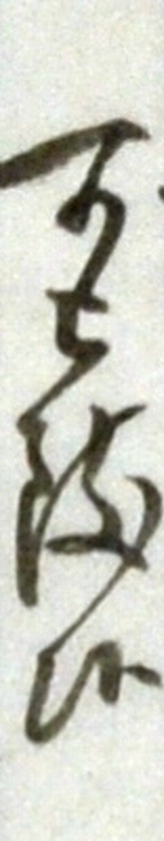可被致候
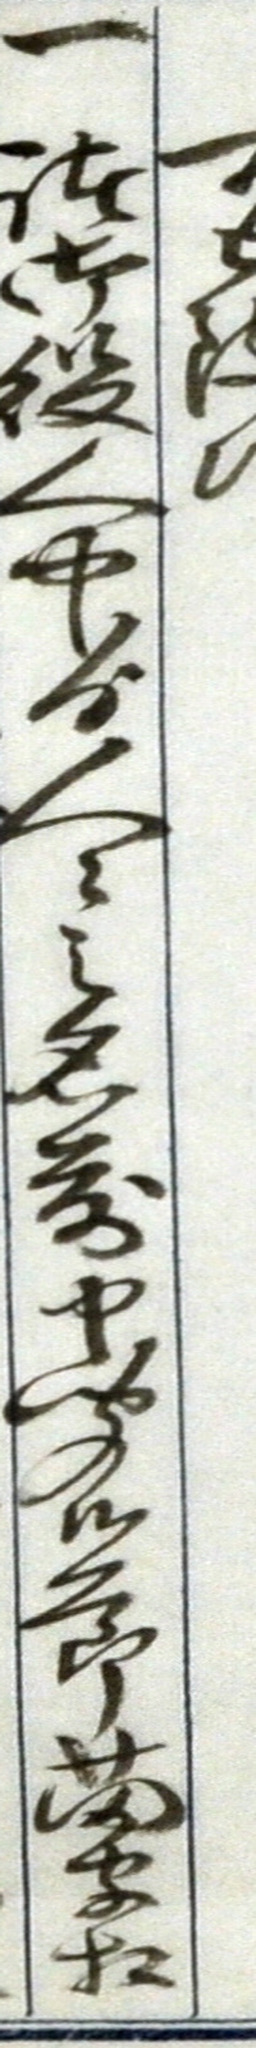一諸御役人中ゟ人々之名前申聞候節苗字相
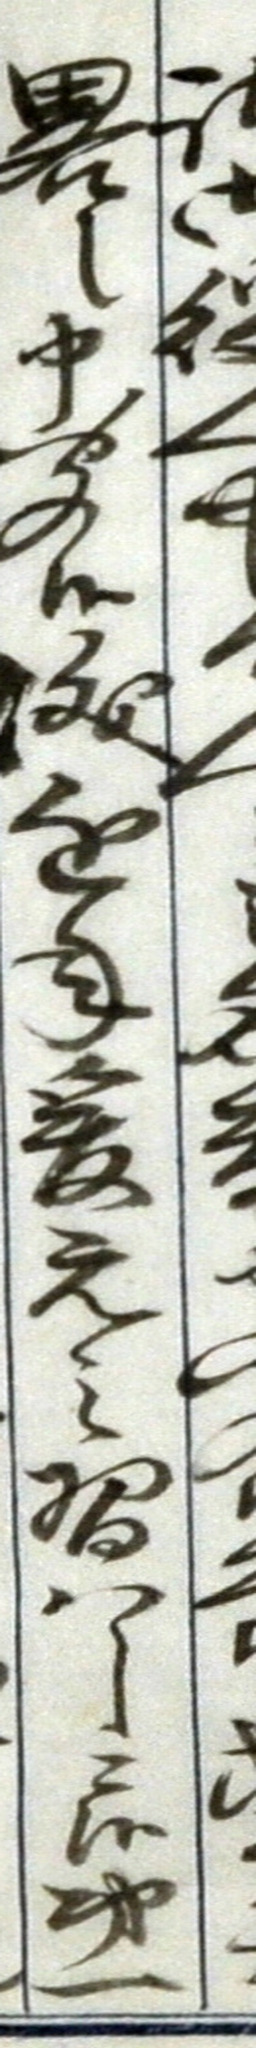略し申聞候儀近年爰元之習ハしニ候第一
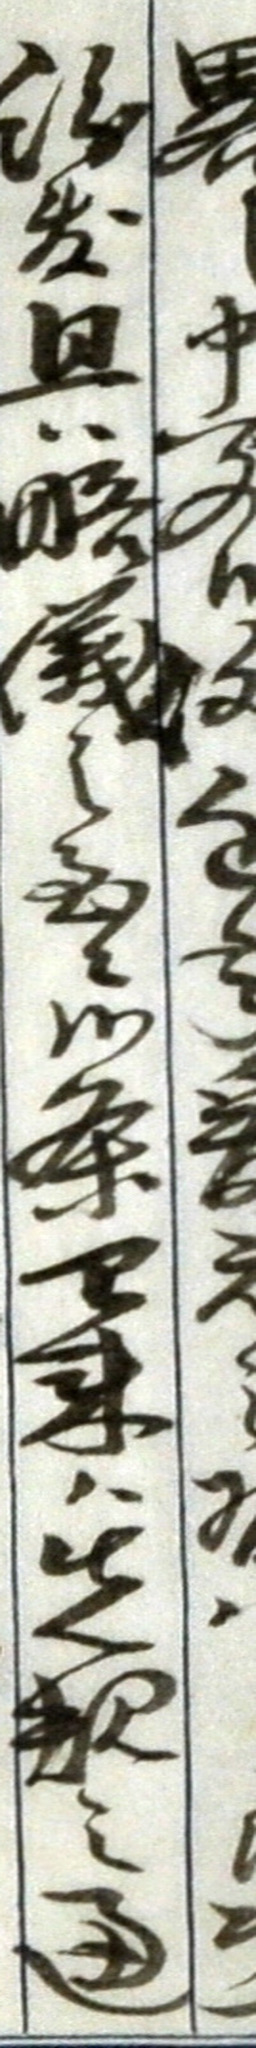紛敷且ハ略儀之至ニ候条已来ハ先規之通
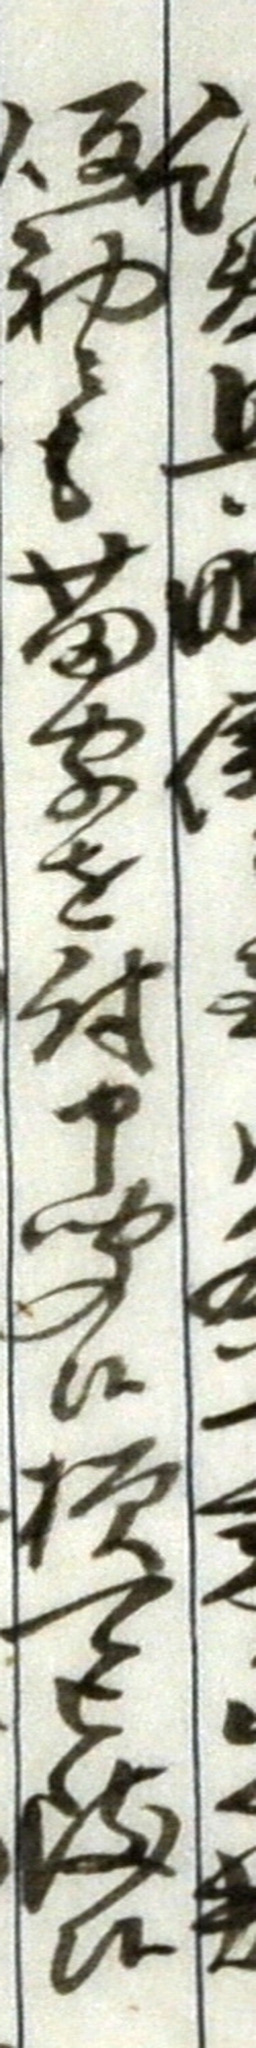仮初ニも苗字を付申聞候様可被致候
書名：御倹約被仰出書
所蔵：伊那市立高遠町図書館・合同会社AMANE
